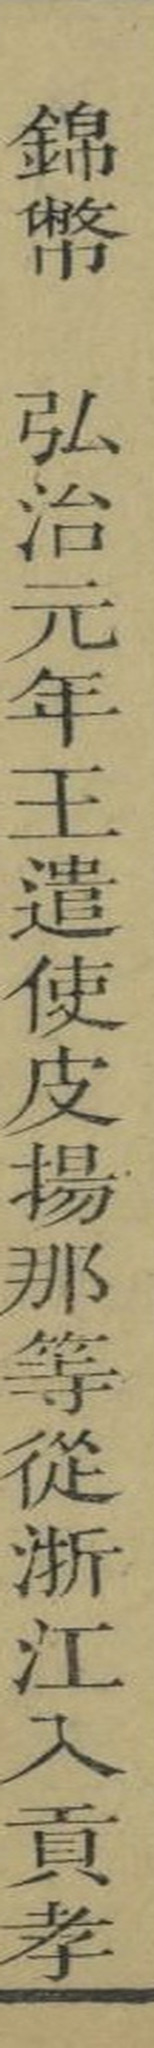錦幣弘治元年王遣使皮揚那等従浙江入貢孝
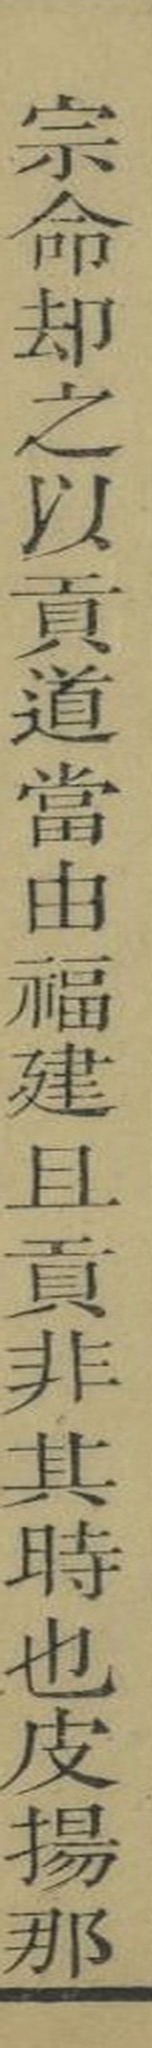宗命却之以貢道当由福建且貢非其時也皮揚那
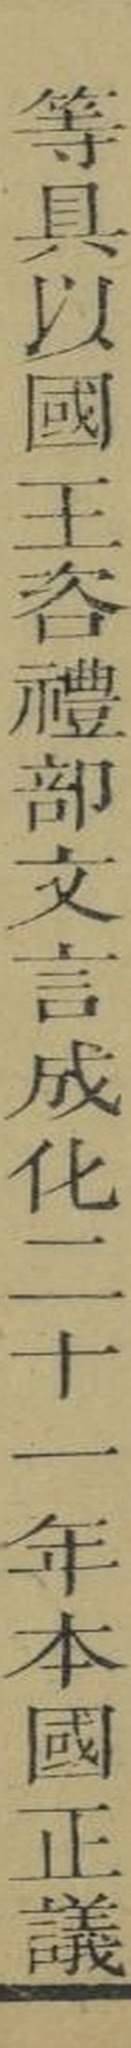等具以国王咨礼部文言成化二十一年本国正議
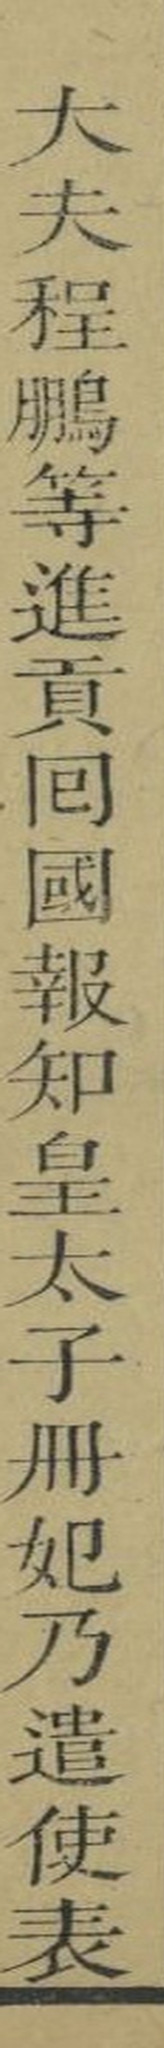大夫程鵬等進貢回国報知皇太子冊妃乃遣使表
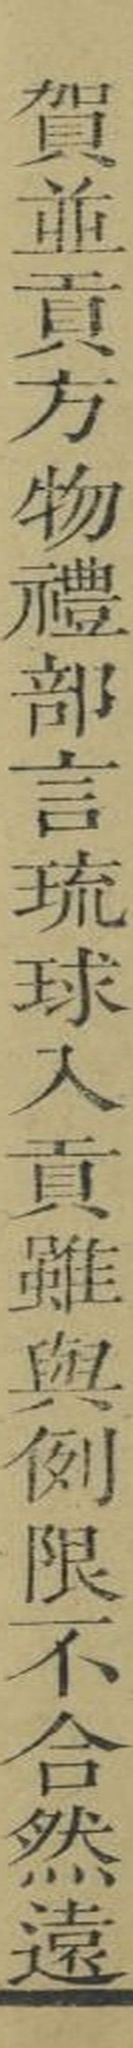賀並貢方物礼部言琉球入貢雖与例限不合然遠
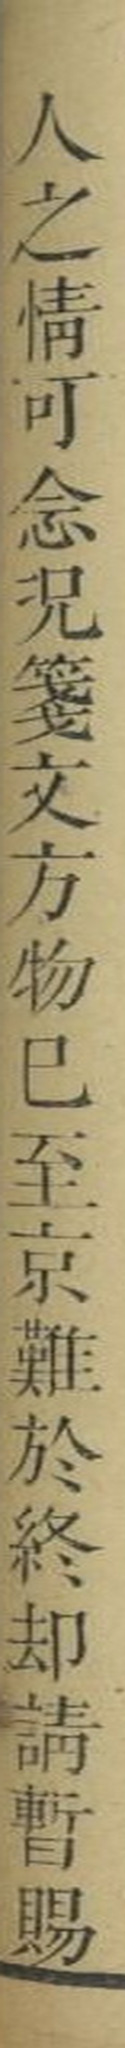人之情可念況箋文方物巳至京難於終却請暫賜
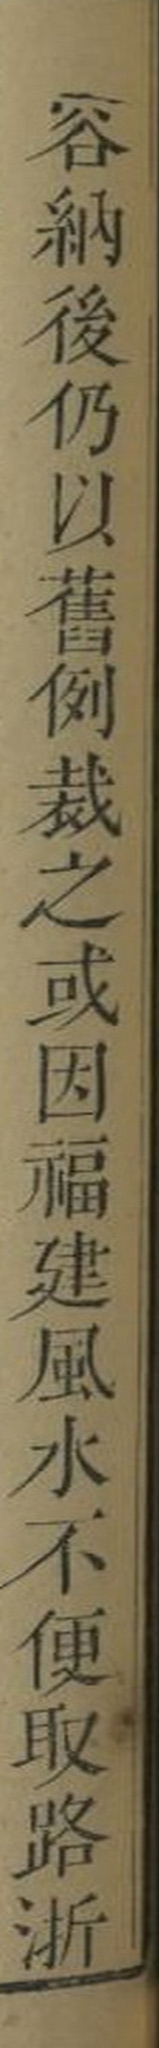容納後仍以旧例裁之或因福建風水不便取路浙
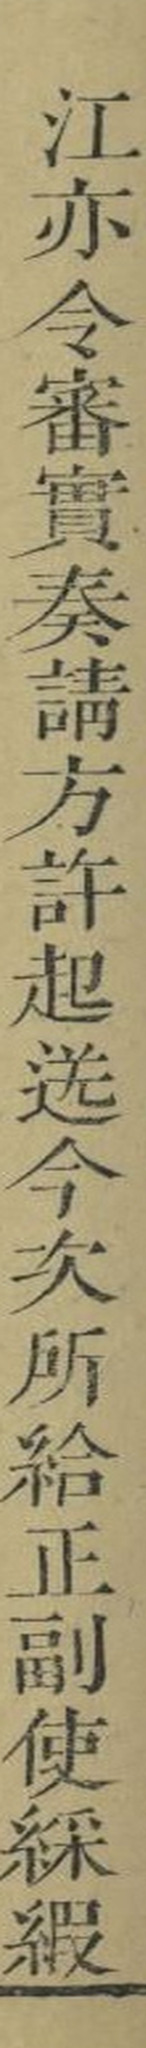江亦令審実奏請方許起送今次所給正副使綵緞
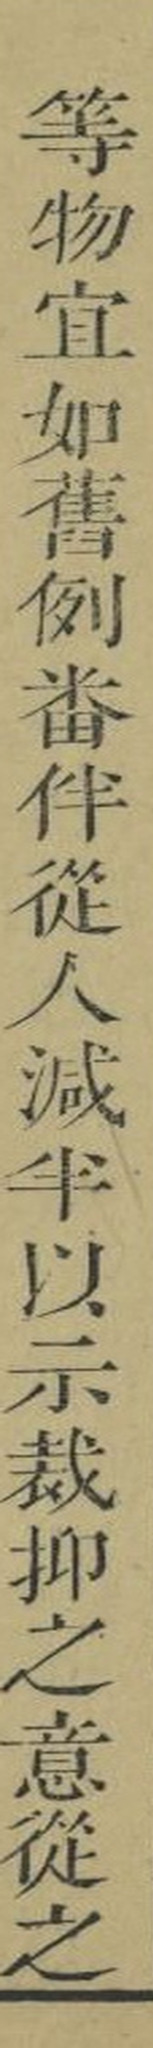等物宜如旧例畨伴従人減半以示裁抑之意従之
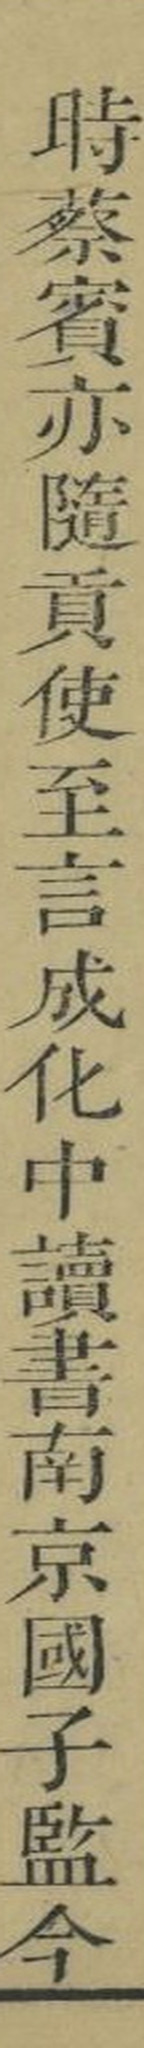時蔡賓亦随貢使至言成化中読書南京国子監今
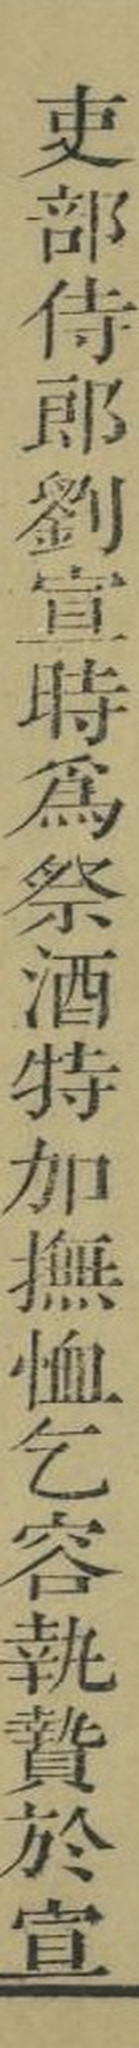吏部侍郎劉宣時為祭酒特加撫恤乞容執贄於宣
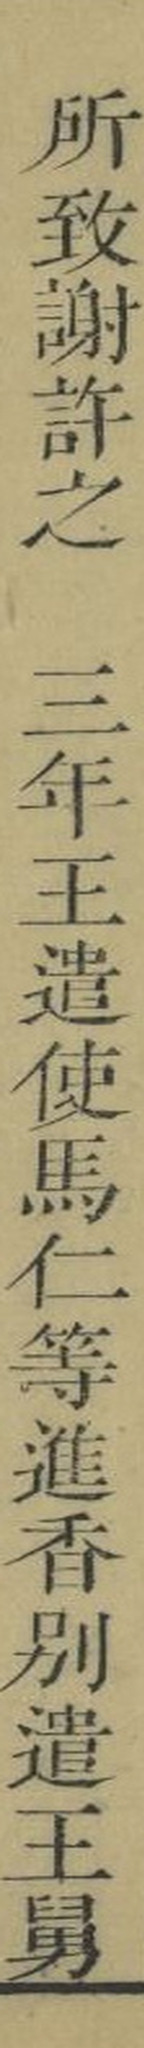所致謝許之三年王遣使馬仁等進香別遣王舅
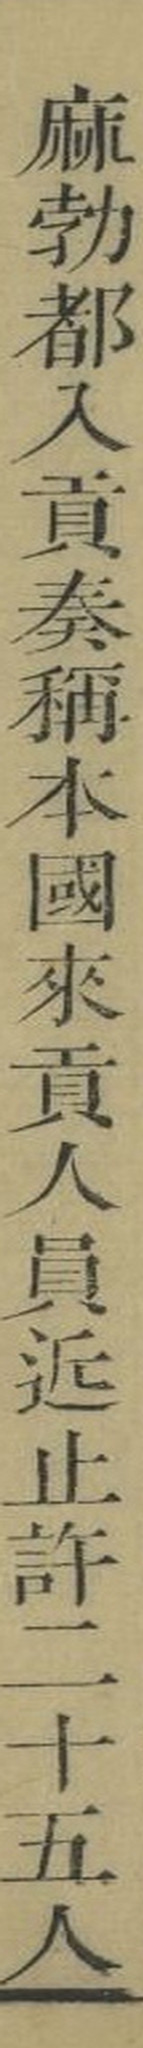麻勃都入貢奏称本国来貢人員近止許二十五人
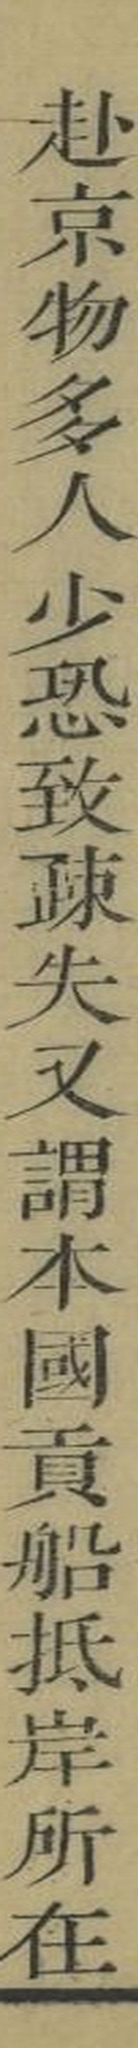赴京物多人少恐致疎失又謂本国貢船抵岸所在
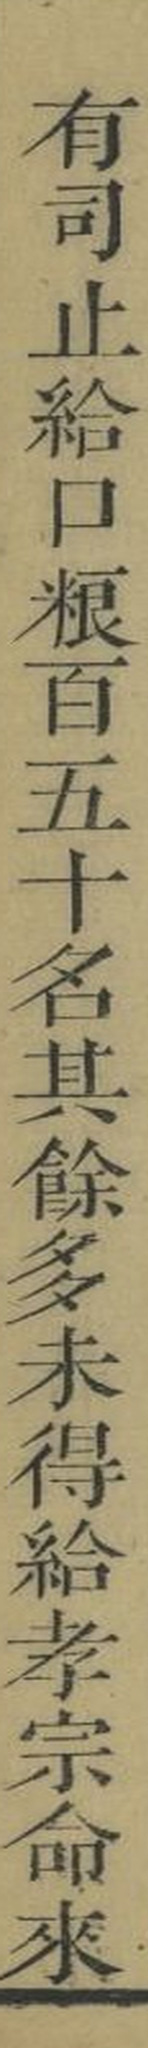有司止給口粮百五十名其余多未得給孝宗命来

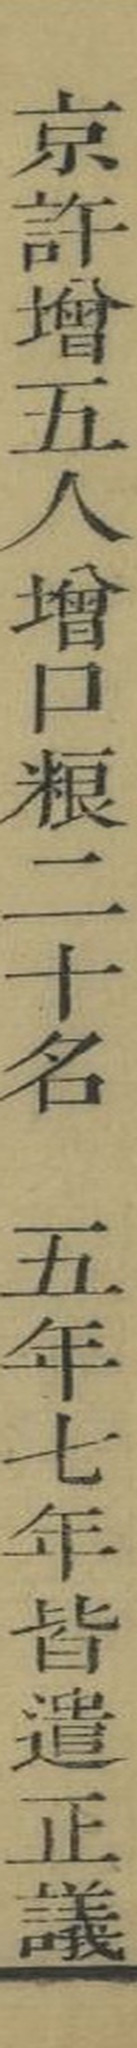京許増五人増口粮二十名五年七年皆遣正議
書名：中山伝信録 巻三
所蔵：University of the Ryukyus Library
